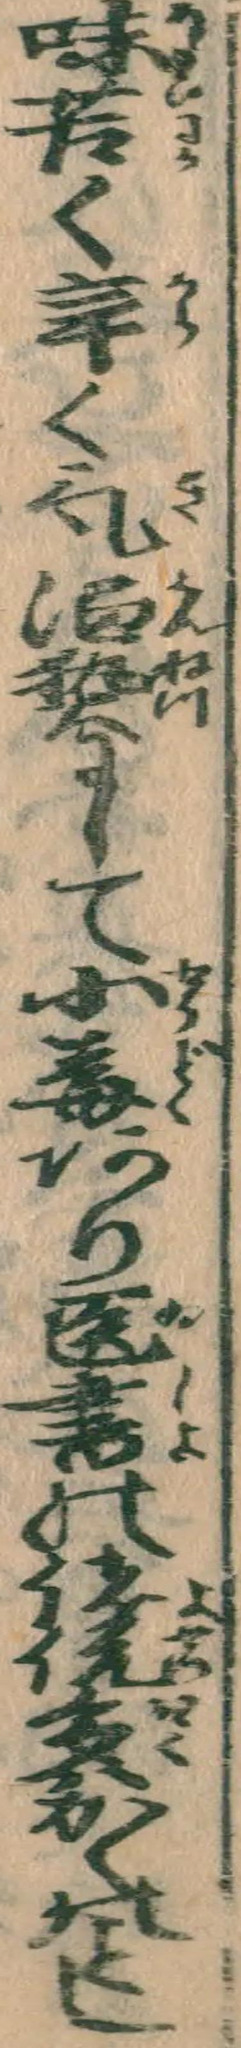味苦く辛く気温熱にして小毒あり医書の諸説多はかくのことし
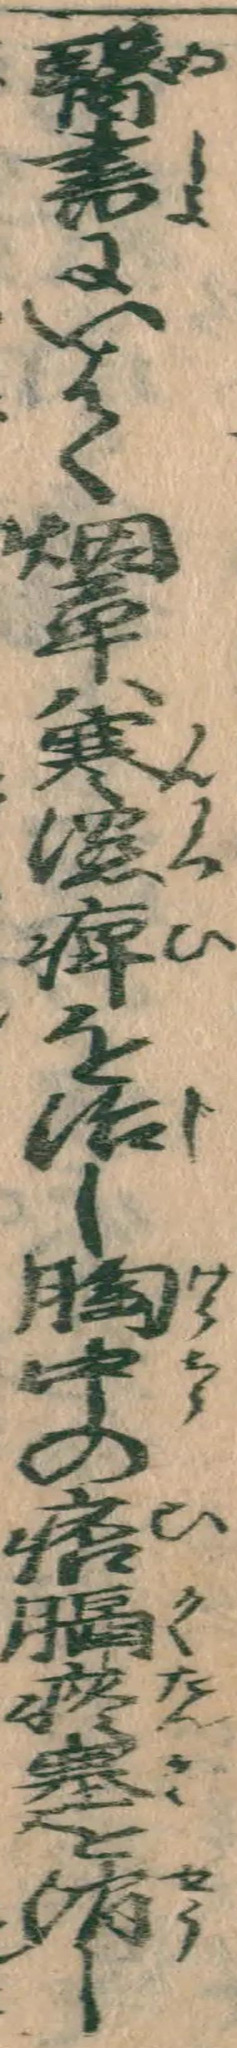医書にいはく烟草は寒湿痺を治し胸中の痞膈痰塞を消し
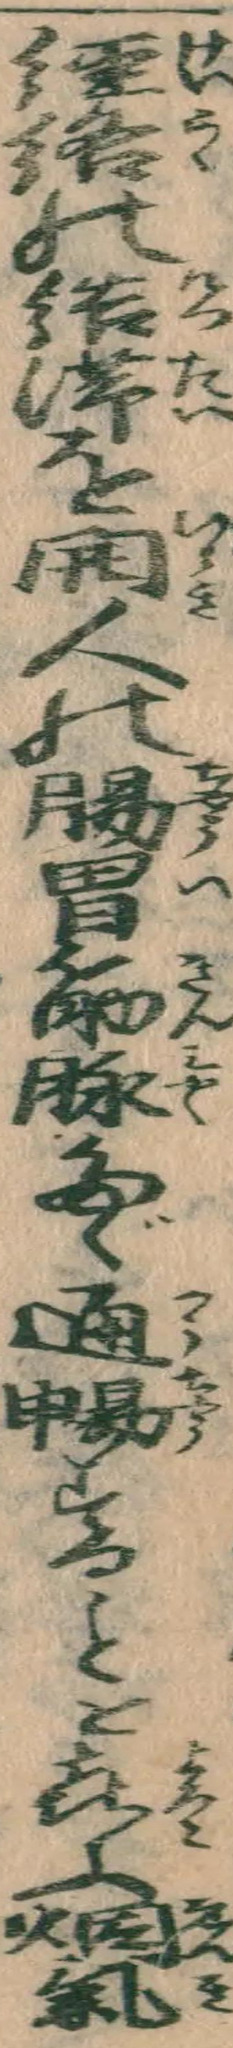経絡の結滞を開人の腸胃筋脈たゞ通暢することと喜ぶ烟気
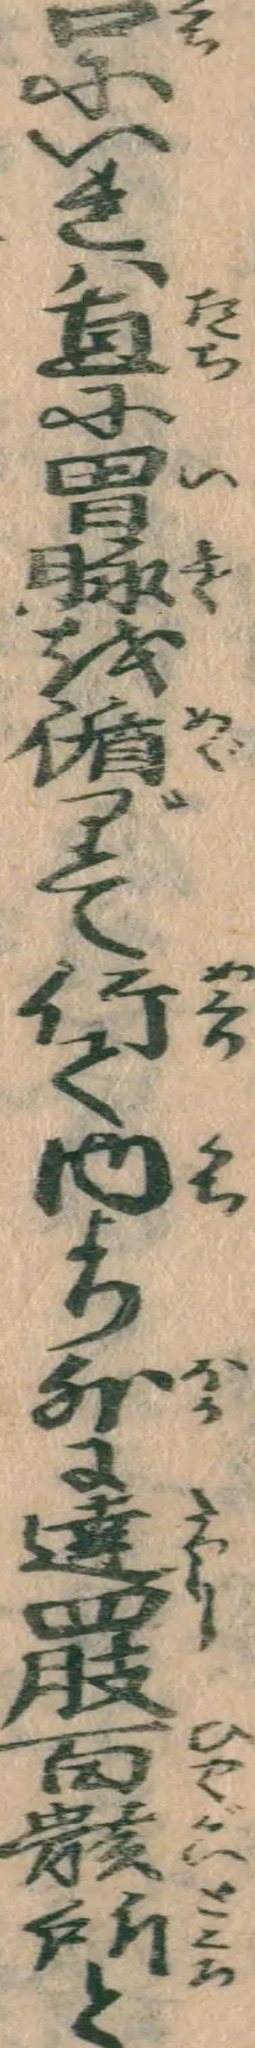口にいれは直に胃脈を循りて行て内より外に達四肢百骸所と
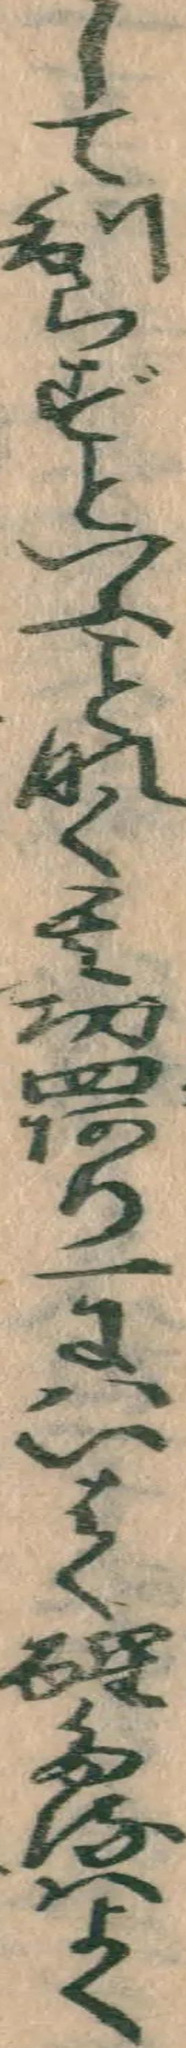して到らずといふことなく其功四あり一にはいはく醒たるはよく
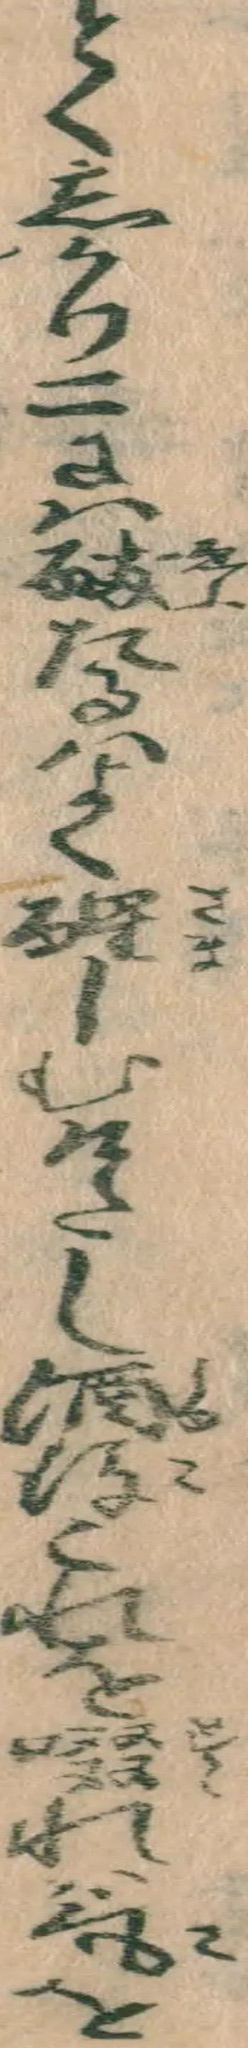とくしかり二には醉たるはよく醒しむけたし酒後これを啜れは気を
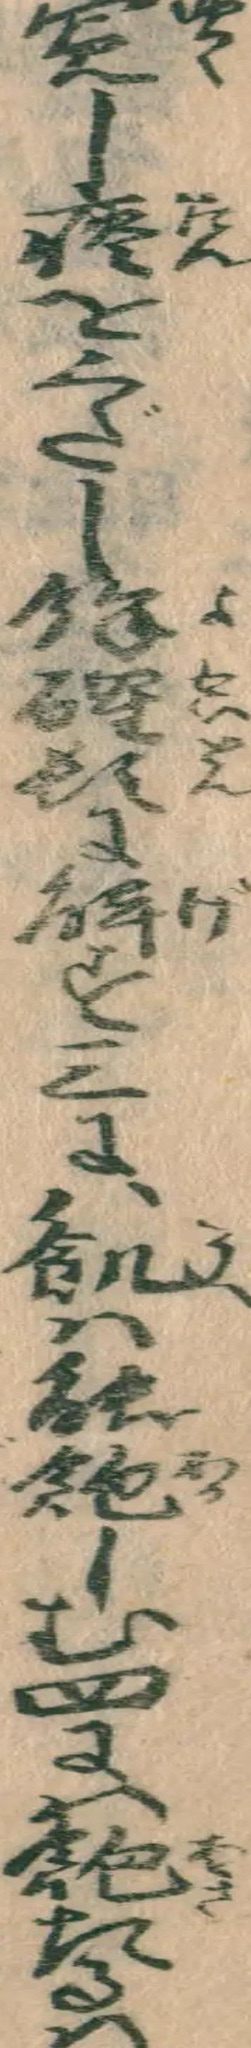寛し痰をくだし余醒頓に解す三には飢は能飽しむ四には飽たるは
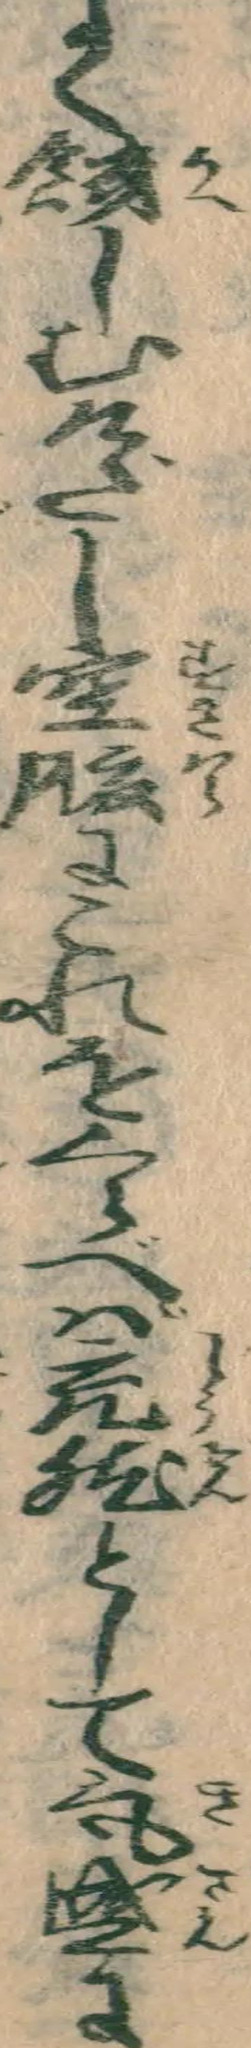よく饑しむけだし空腹にこれをくらべば充然として気盛に
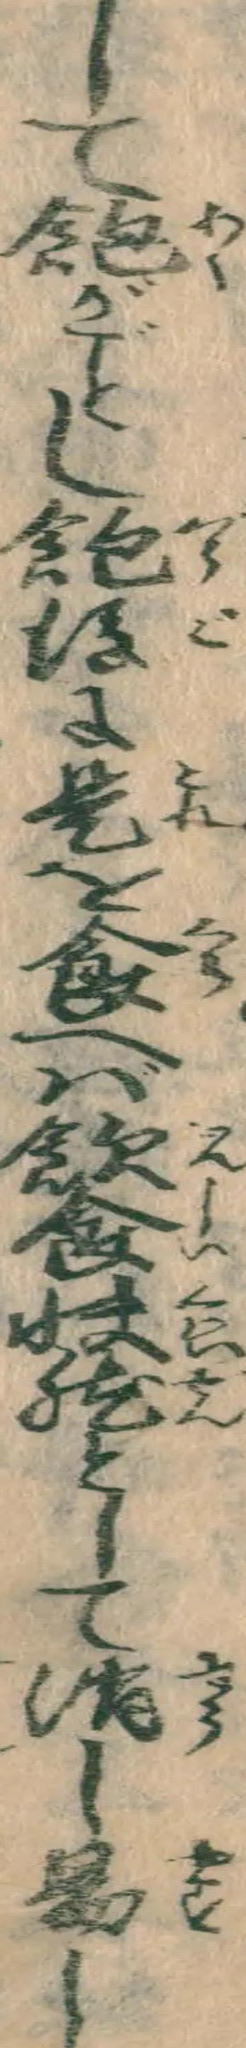して飽がごとし飽後に是を食へば飲食快然として消し易し
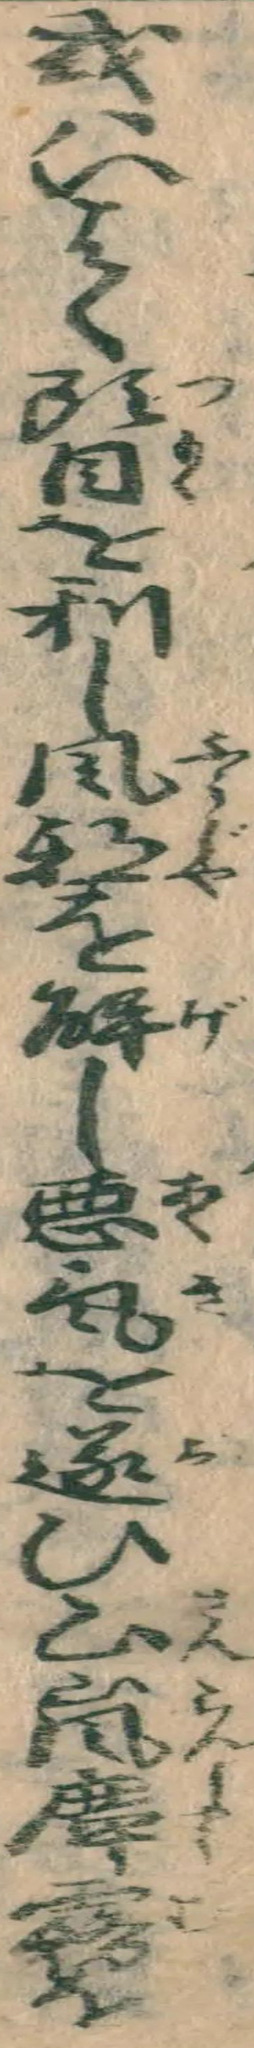或はいはく頭目を利し風邪を解し悪気を逐ひ山嵐瘴霧を

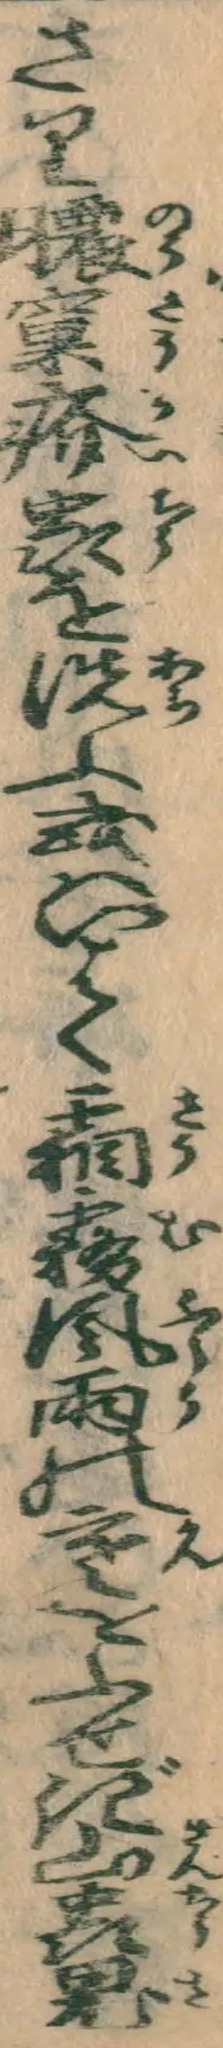さり膿窠疥虫を洗ふ或はいはく霜霧風雨の寒をふせぎ山虫鬼
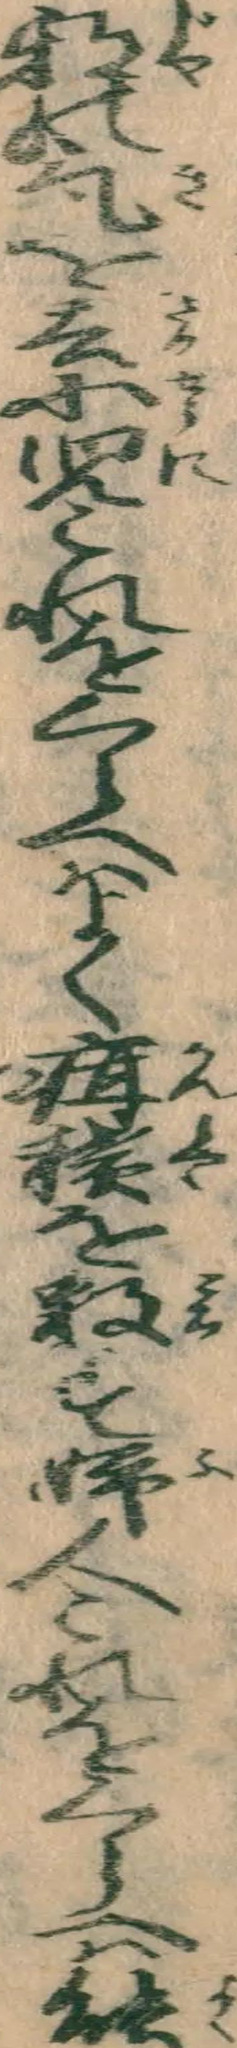邪の気を去小児これをくらへはよく疳積を殺す婦人これをくらへは能
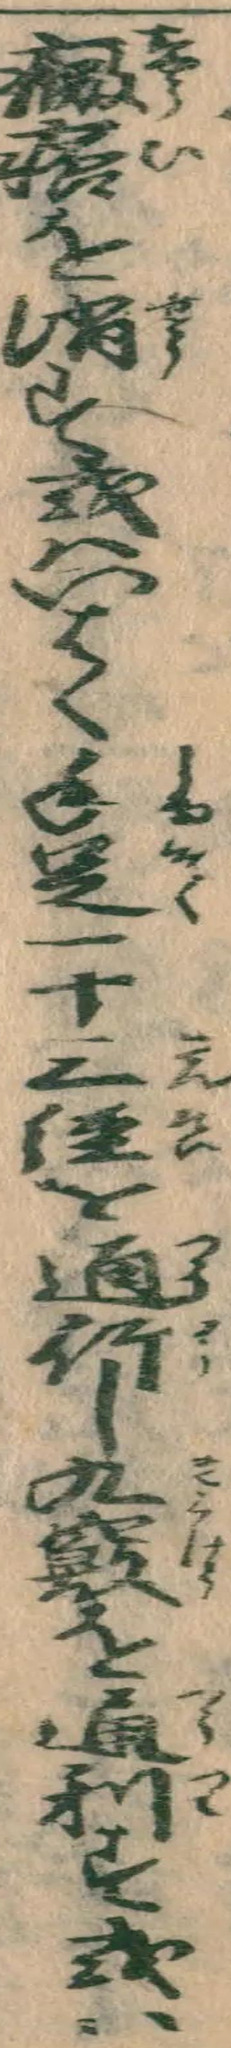癥痞を消す或はいはく手足一十三徑を通行し九竅を通利す或は
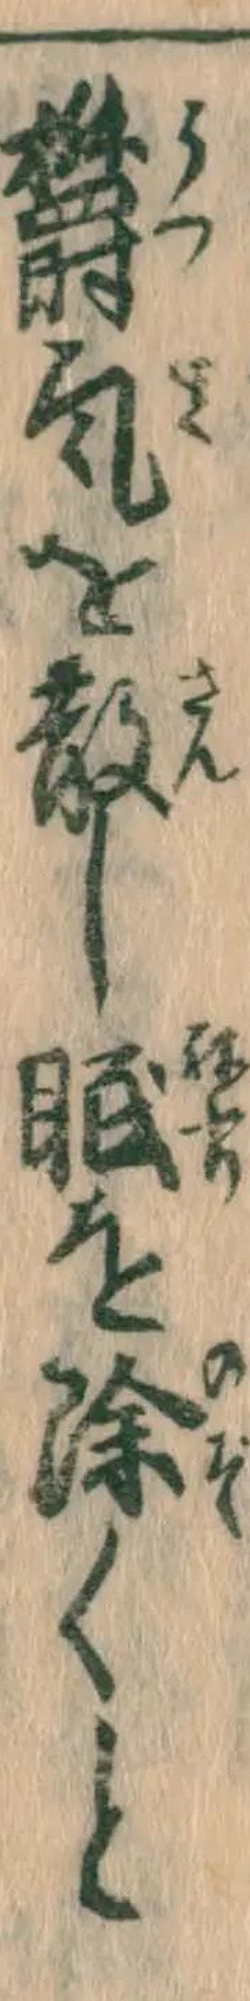鬱気を散し眠を除くと
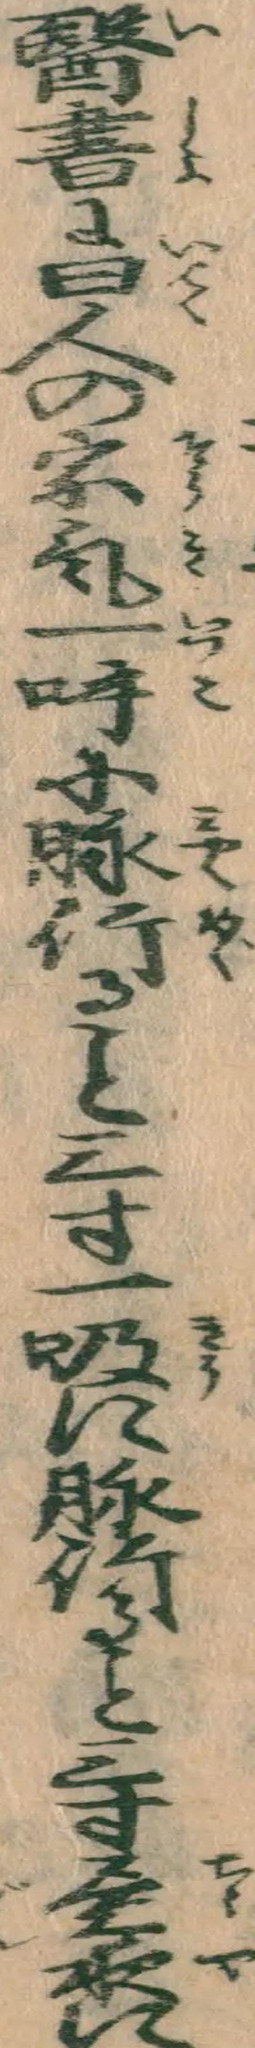医書に曰人の宗気一呼に脈行ること三寸一吸に脈行ること三寸昼夜に
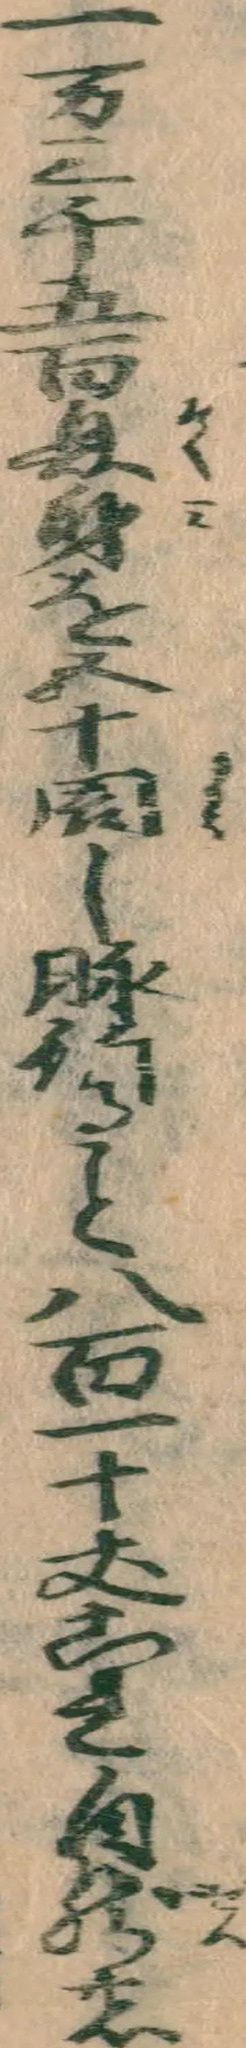一万三千五百息身を五十周し脈行ること八百一十丈これ自然の
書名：煙草記
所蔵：国立国会図書館 National Diet Library, JAPAN
